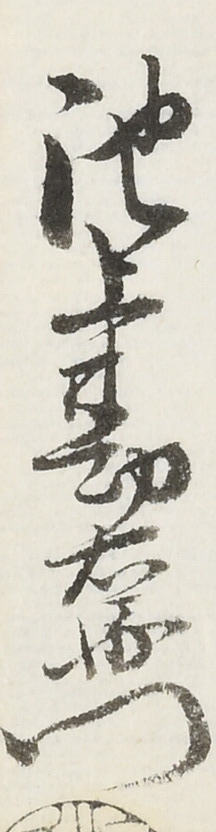池上勘右衛門㊞
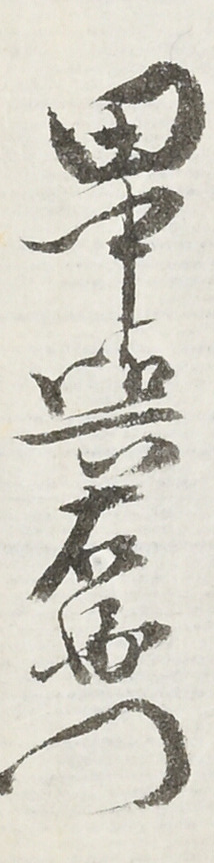田中与右衛門
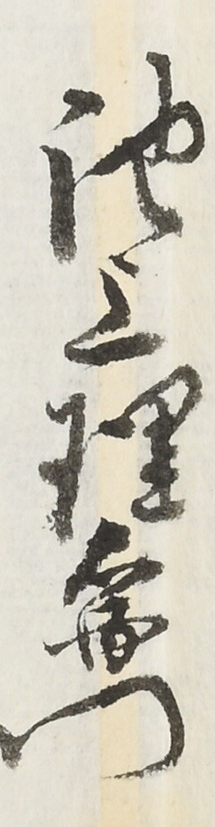池上理右衛門㊞
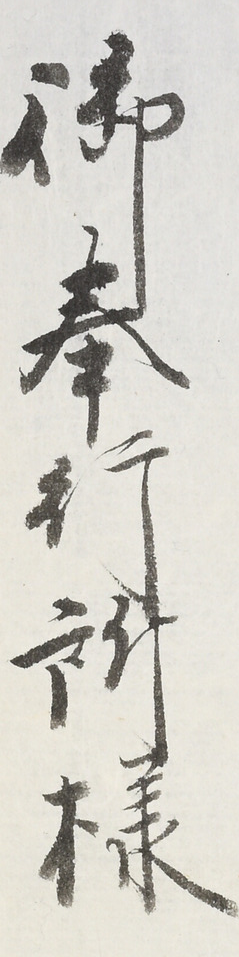御奉行所様

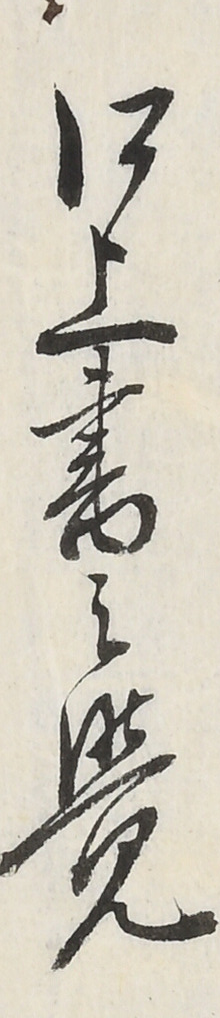口上書之覚
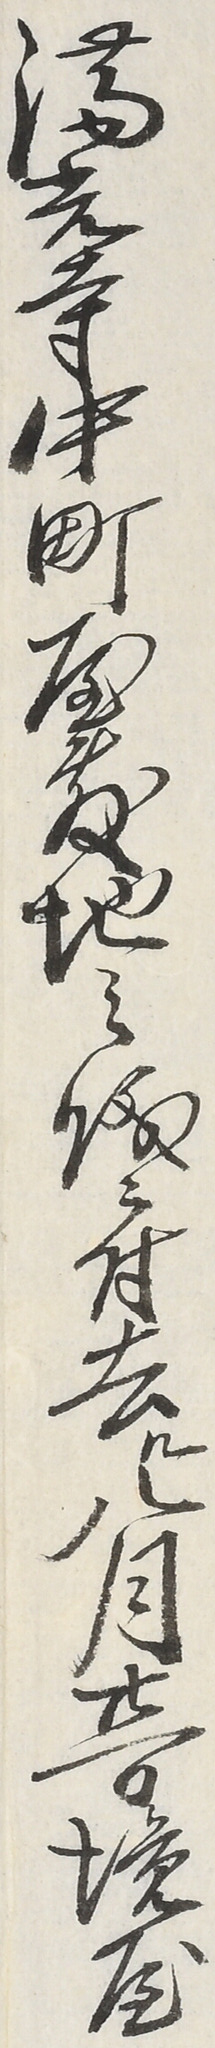満光寺中町屋敷地之儀ニ付去ル八月廿一日境屋
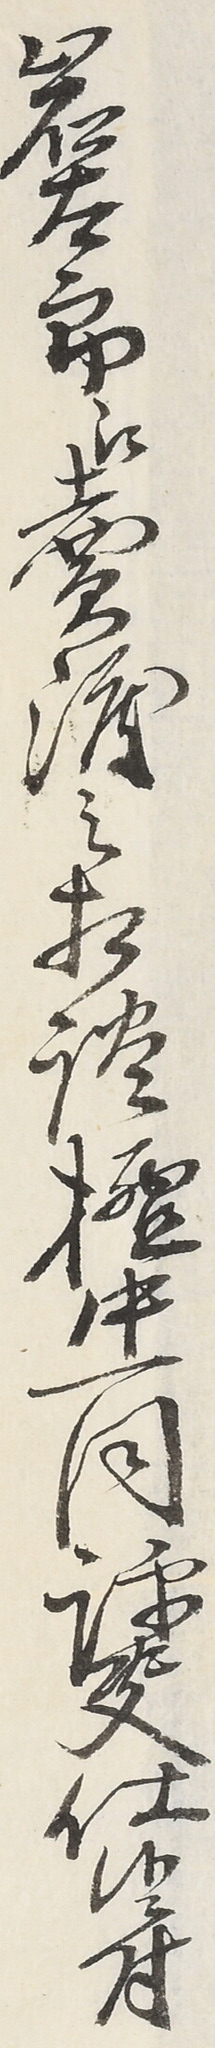岩太郎江売渡之相談檀中一同評決仕候ニ付
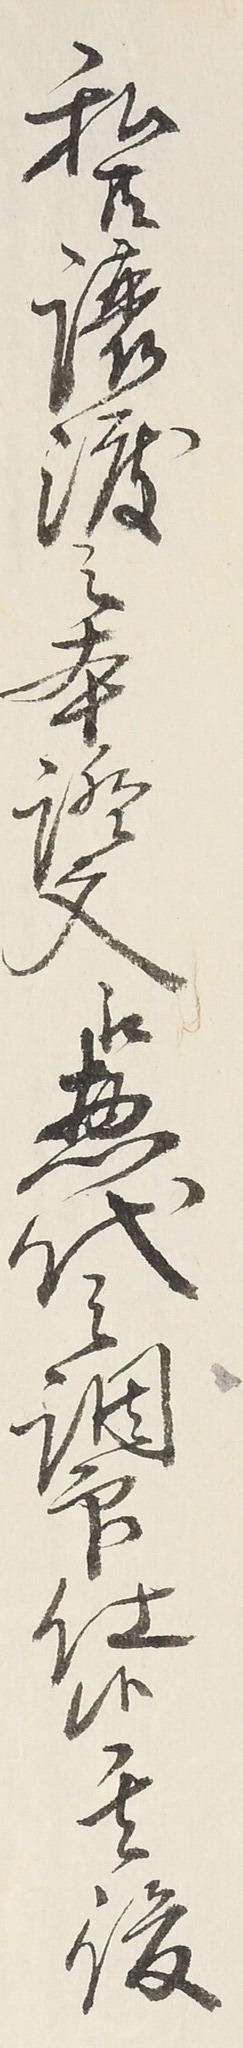私共譲渡之本証文江惣代之調印仕其後
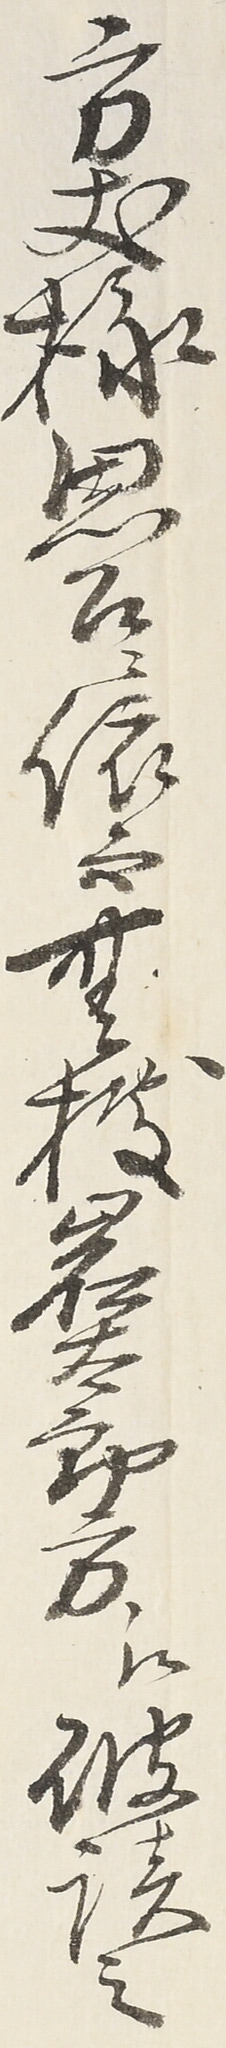方丈様思召ニ依而無拠岩太郎方江破談之
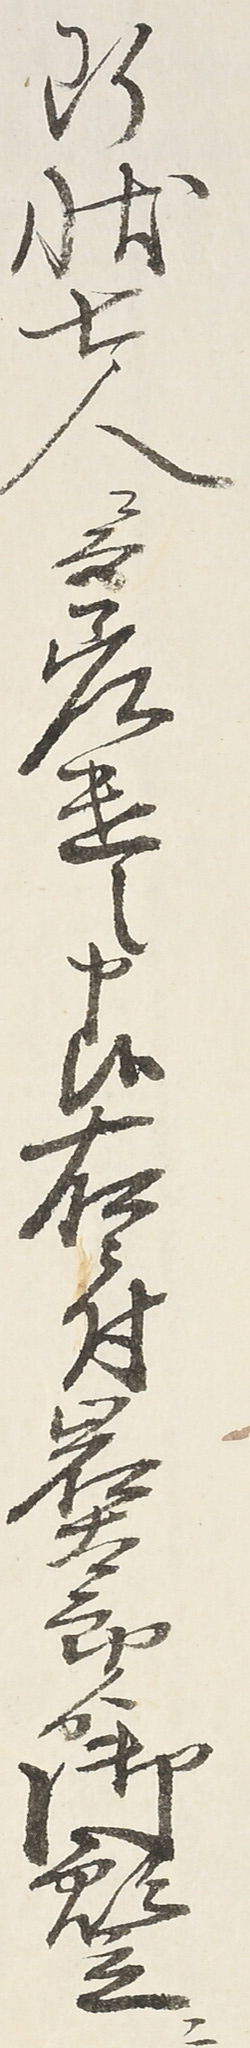改状七人ニ而差遣し申候右ニ付岩太郎ゟ御願立ニ
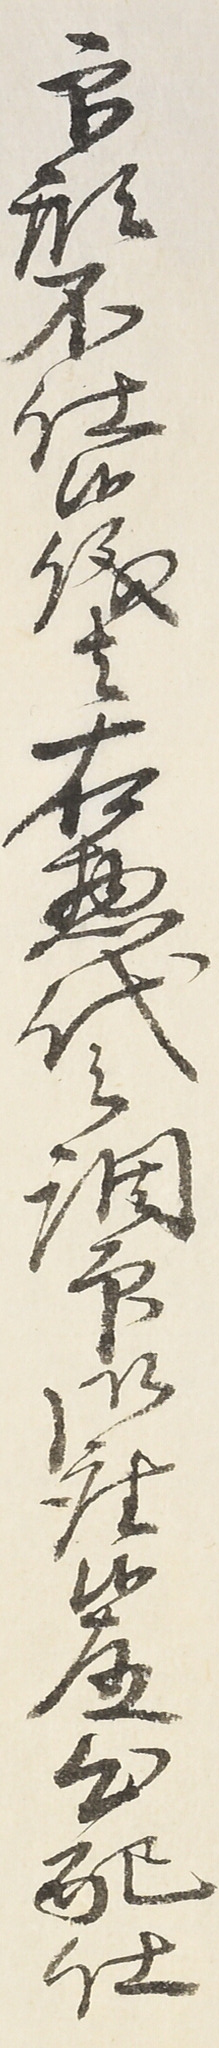印形不仕候儀者右惣代之調印御座候故心配仕
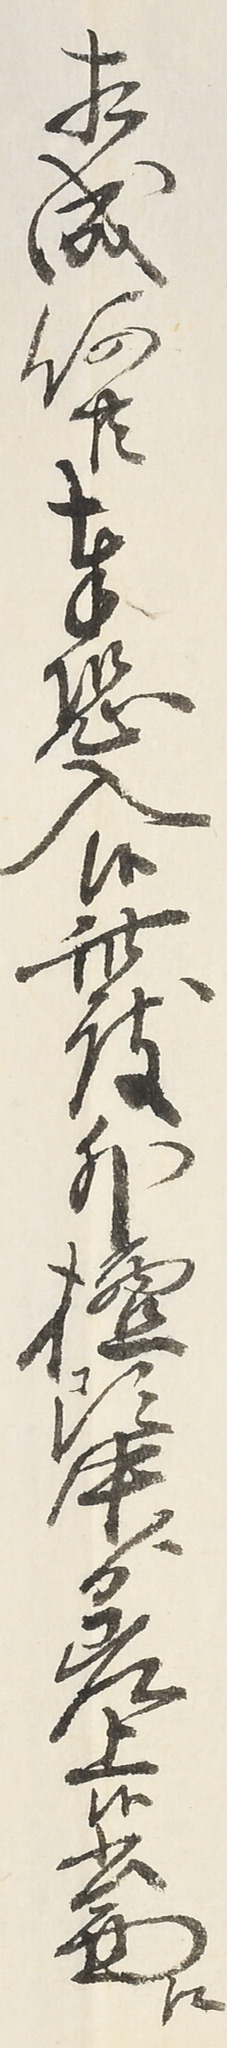相成何共奉恐入候此度外檀頭中ゟ差上候書面江
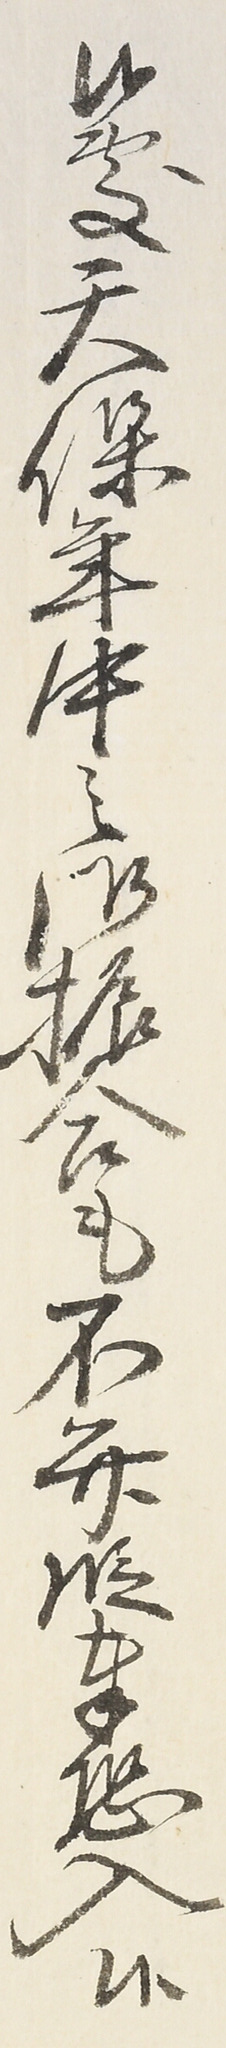候処天保年中之御振合も不弁段奉恐入候
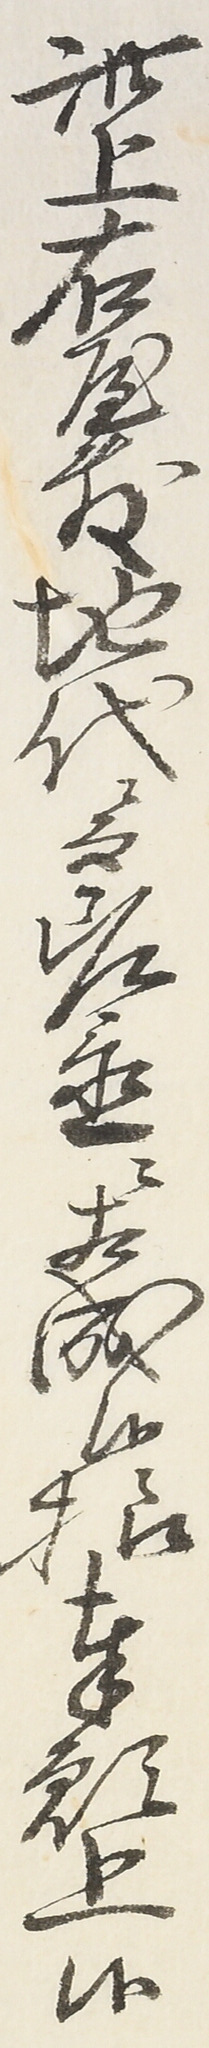此上右屋敷地代ニ而差置ニ相成候様奉願上候
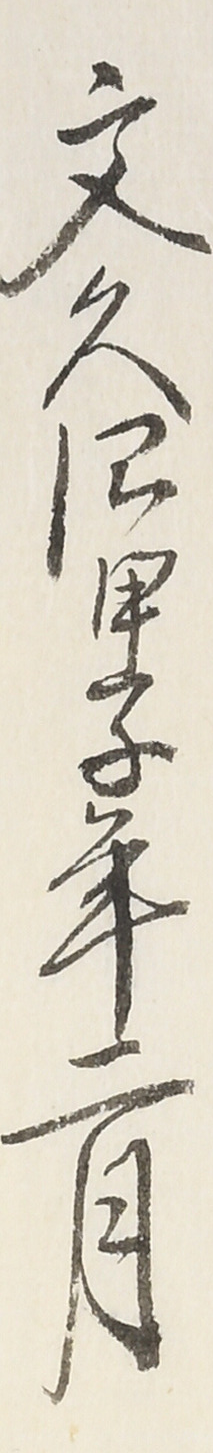文久四甲子年二月
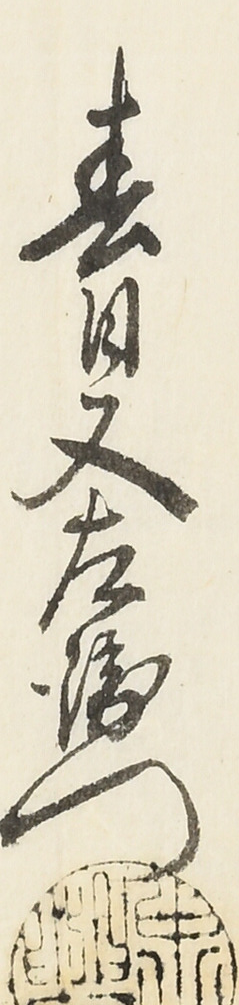春日又左衛門㊞
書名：乍恐以口上書奉願上候御事
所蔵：伊那市立高遠町図書館・合同会社AMANE
